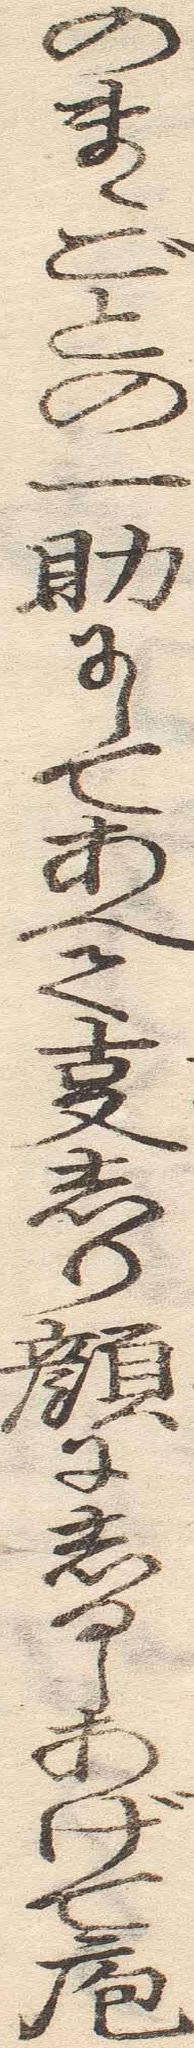のまヽごとの一助にしてあへて事しり顔にしるしあげて庖
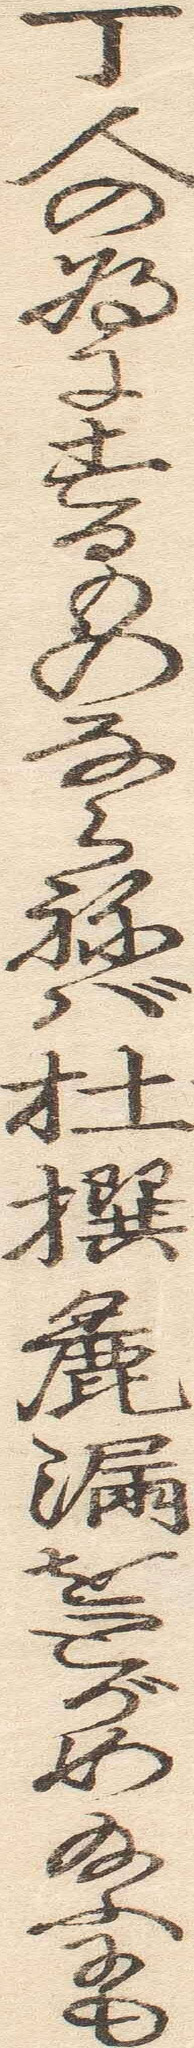丁人の為にするものならねば杜撰麁漏をとがめ給ふにも
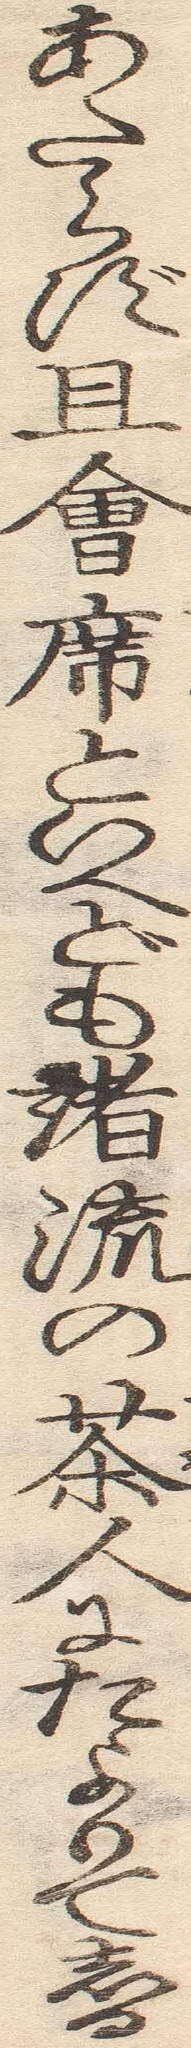あたらず且会席といへども諸流の茶人にたよりてしる
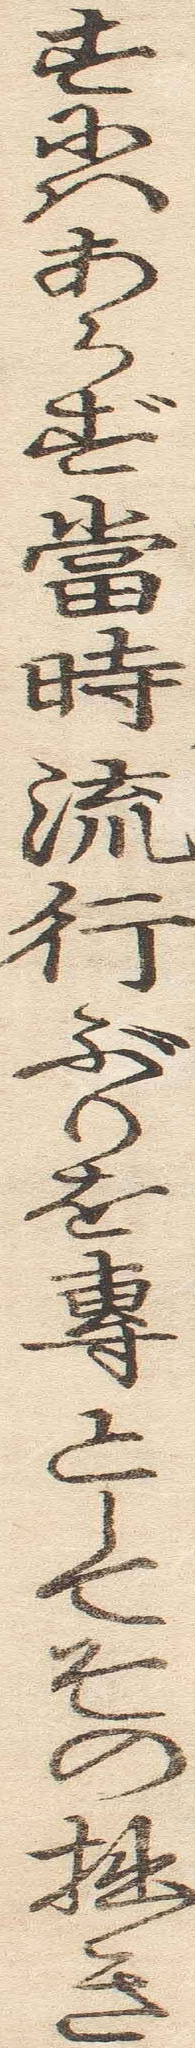すにはあらず当時流行ぶりを専としてその拙き
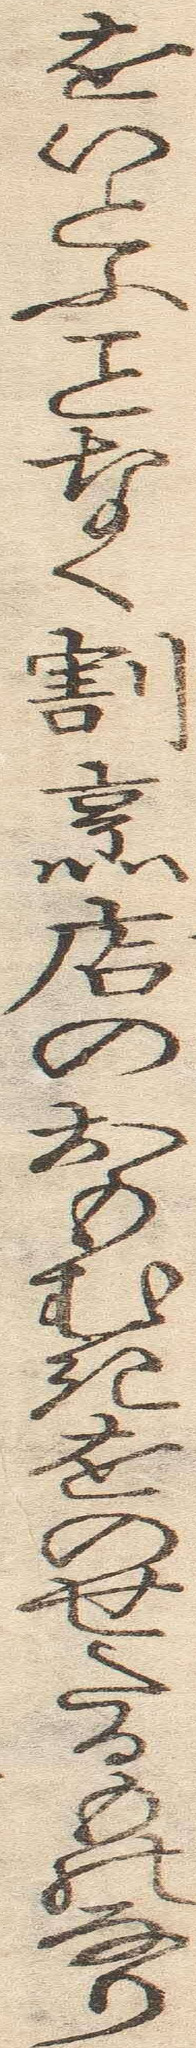をいとふことなく割烹店のおもむきをのせたるものなり
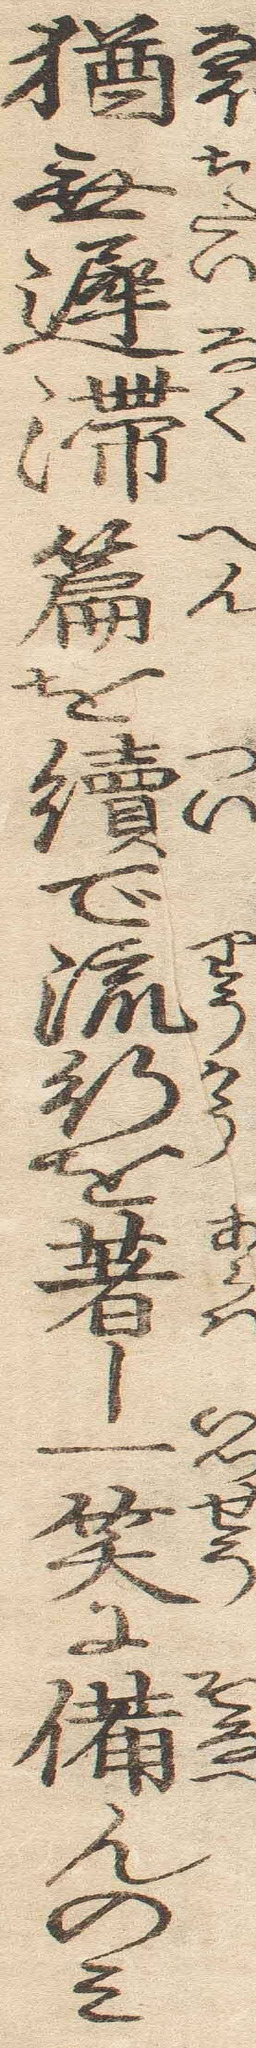猶無遅滞篇を続で流行を著し一笑に備んのみ

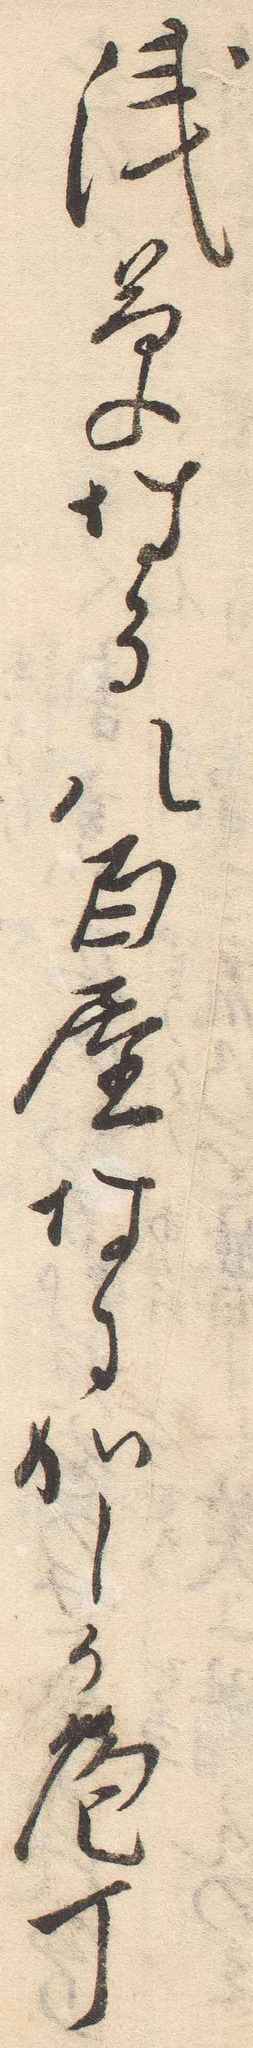浅草なる八百屋なにかしか庖丁
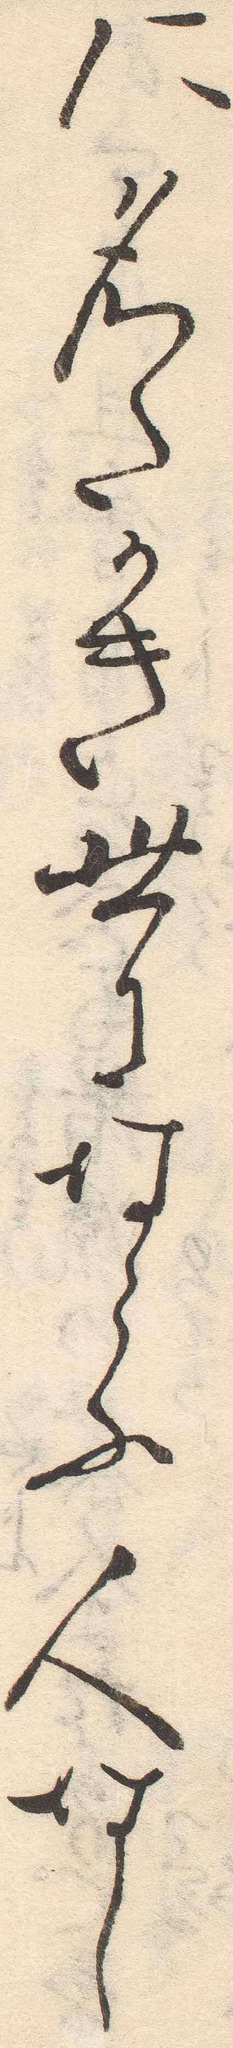に名たかき世にならふ人なし
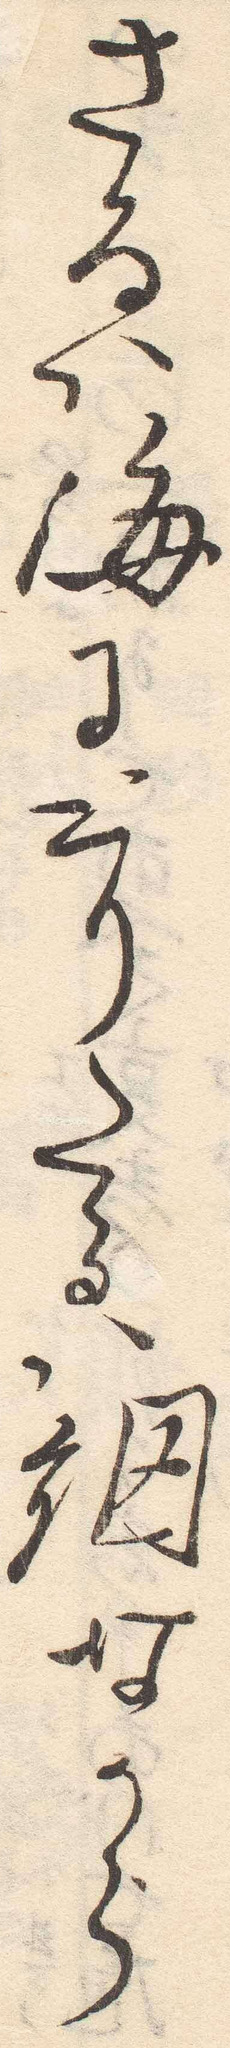さるは海にごりたるは網なから
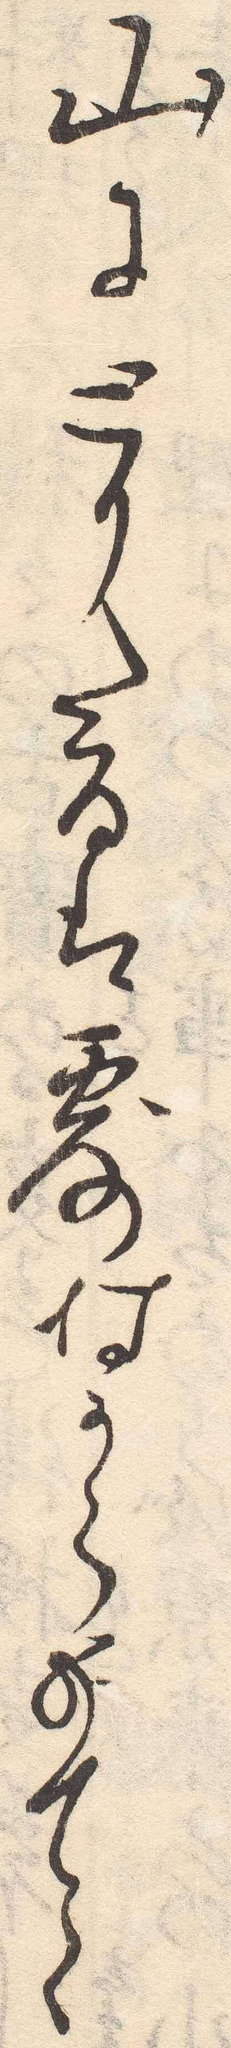山にごりたるは露なからもてゝ
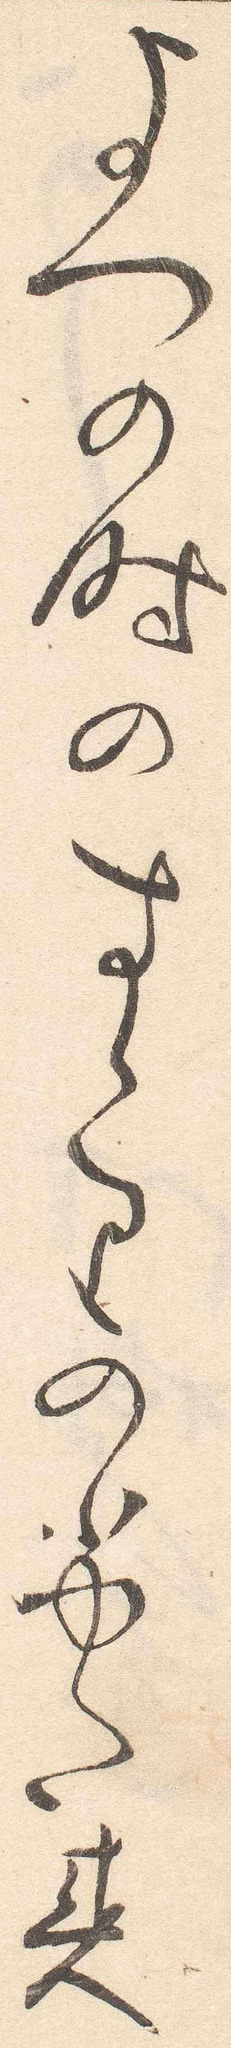よつの時のすゝりのふた春
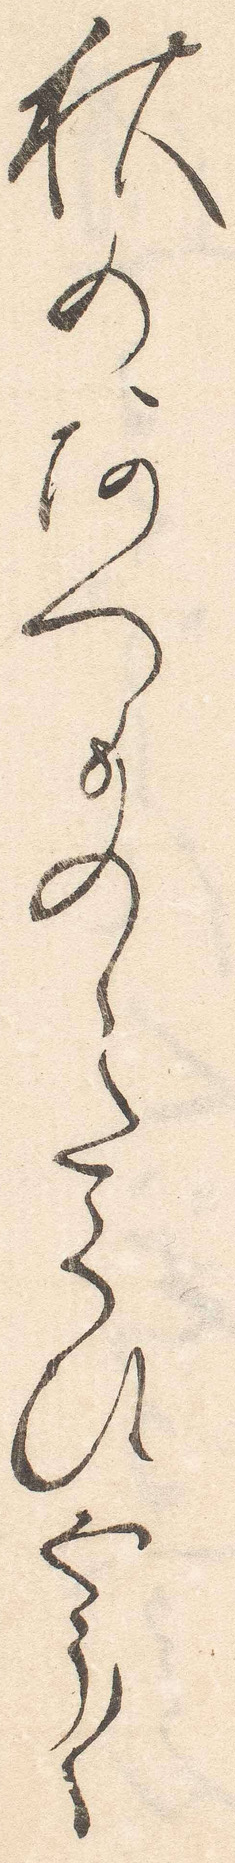秋のあつものゝたくひやう〳〵
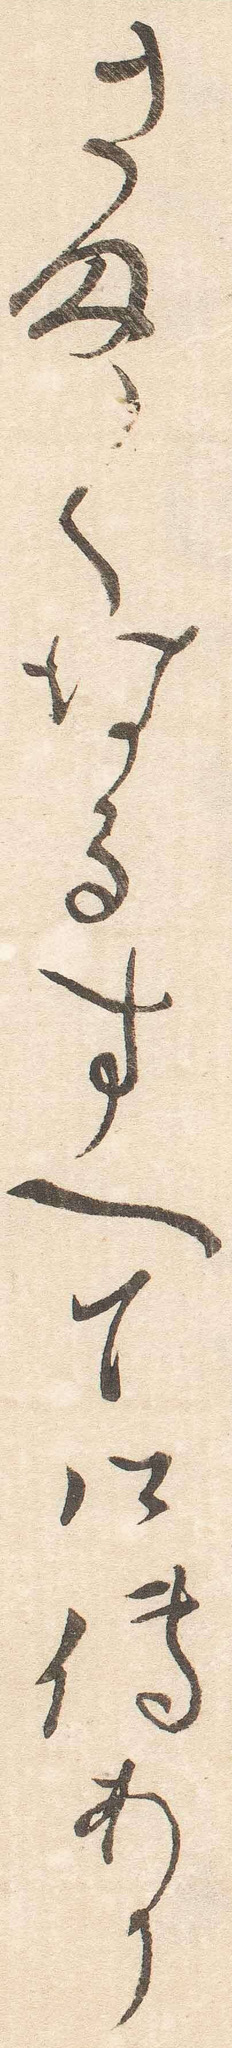さま〳〵なるすへて口伝あり
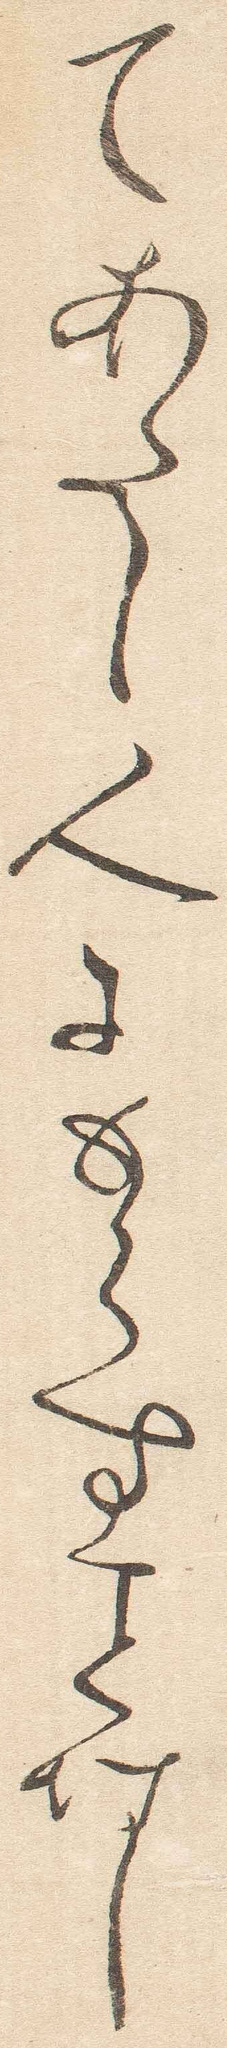てあたし人にもらすことなし

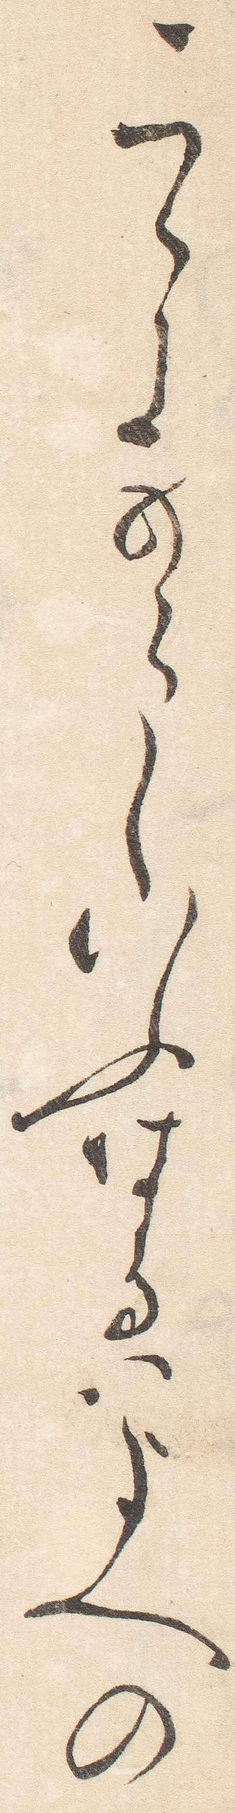こゝにもらしいふはるはよへの
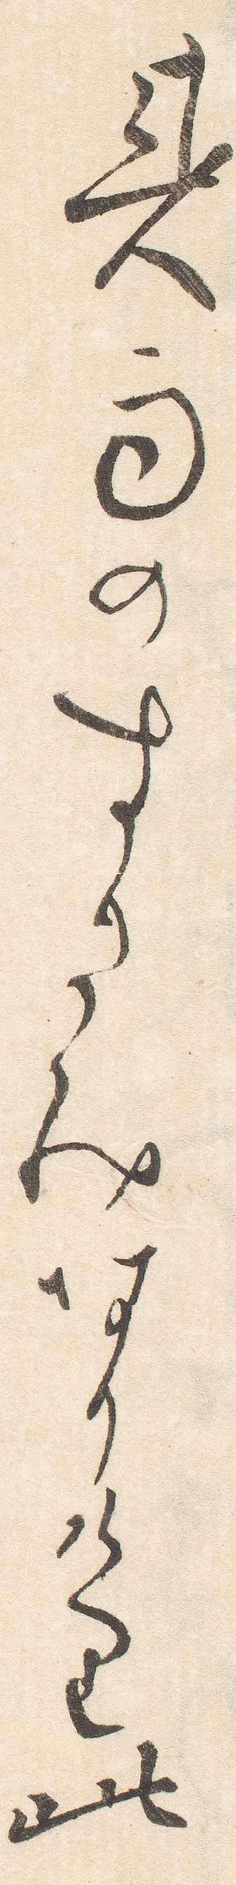春雨のすさみなりけり此
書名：料理通
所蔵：東京学芸大学附属図書館 国文学研究資料館
